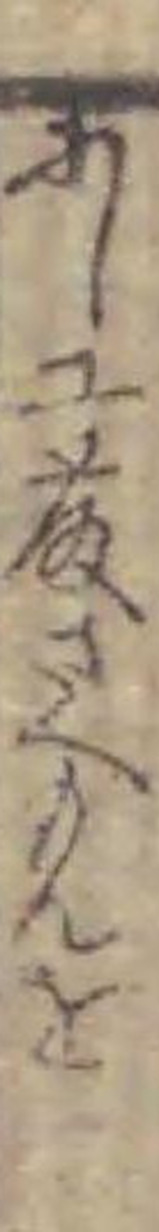にし工藤さへもんを
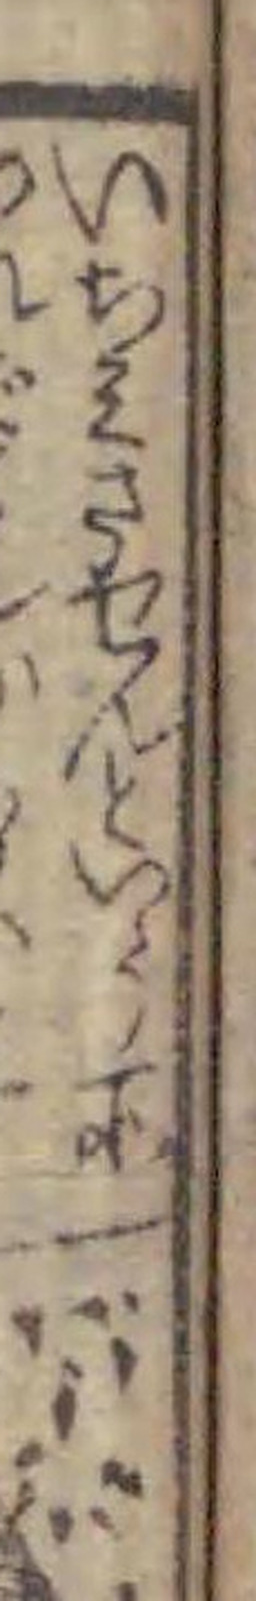いちみさせんという所
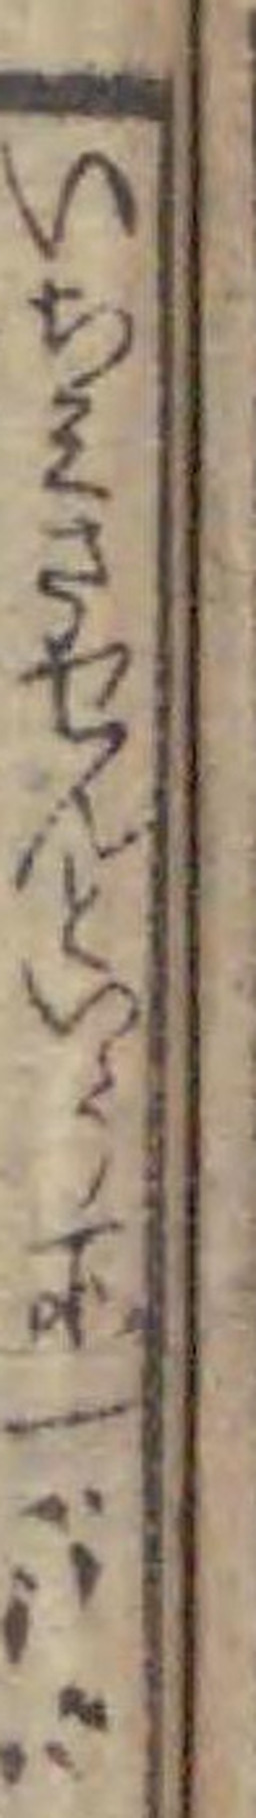いちみさせんという所
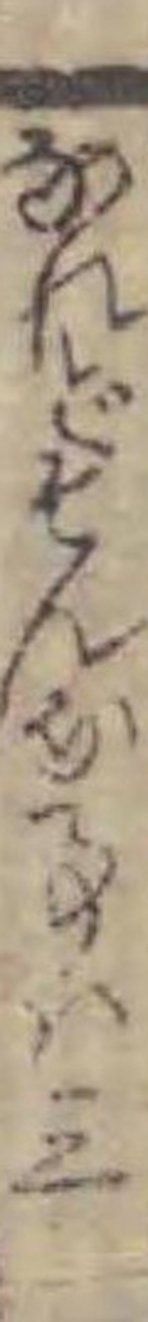なれどそんな事は三
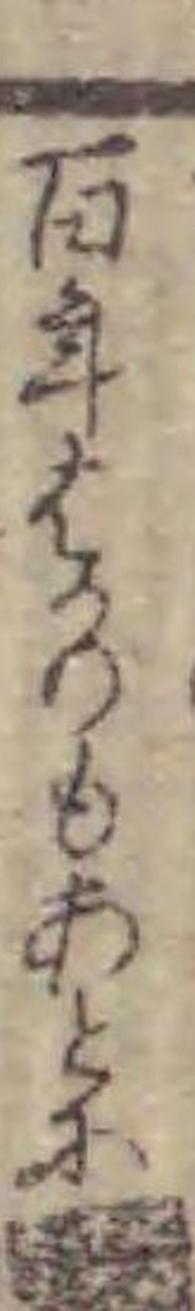百年はかりもあとに
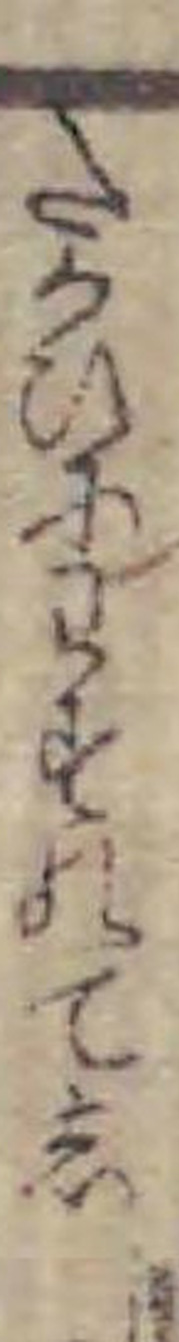たかひにわすれてし
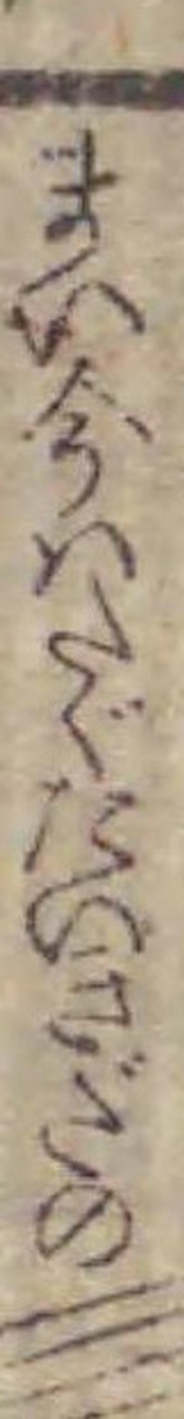まい今はたゞたいきだの
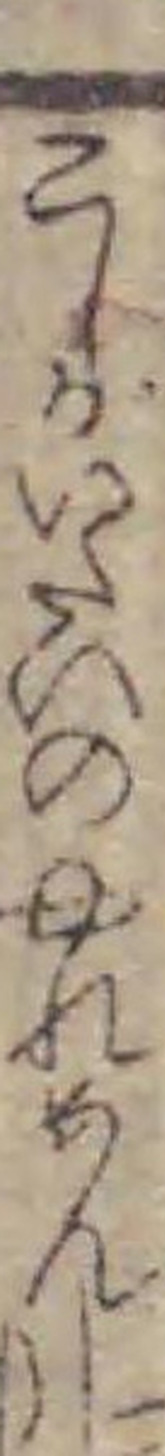こしがいたいのやれめん
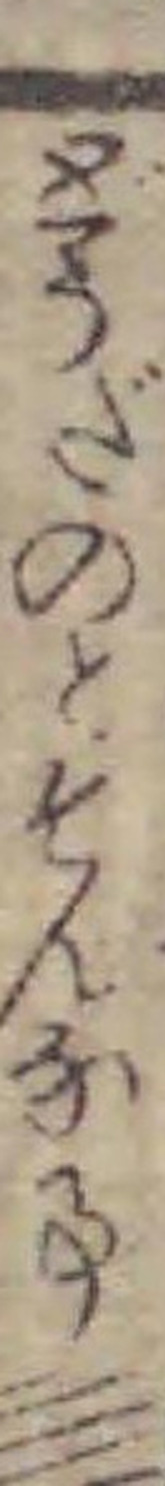どうだのとそんな事
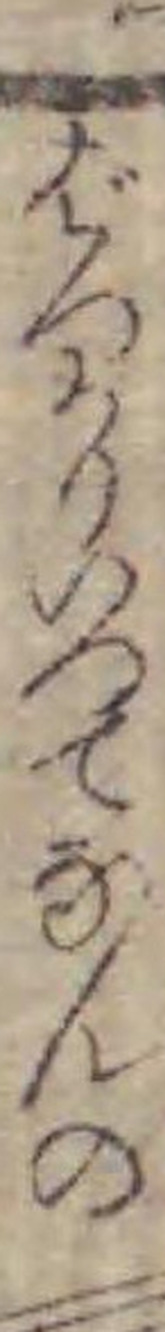ばつかりいつてなんの
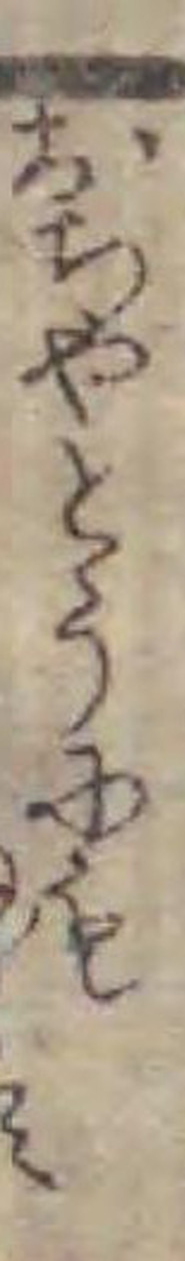おちやとうにも
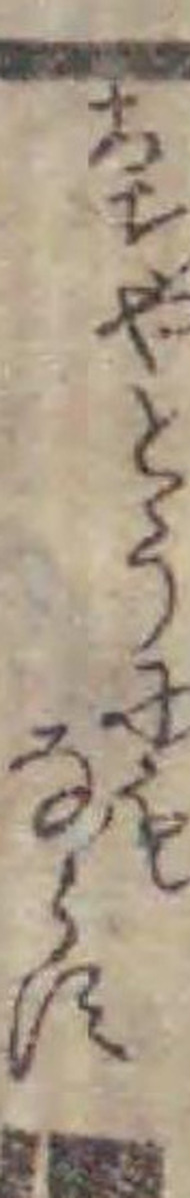おちやとうにも
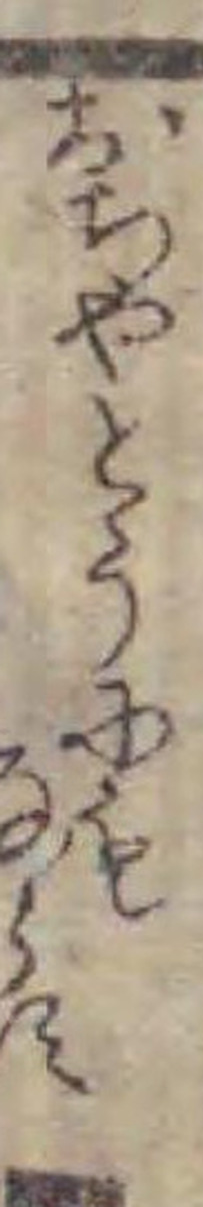おちやとうにも
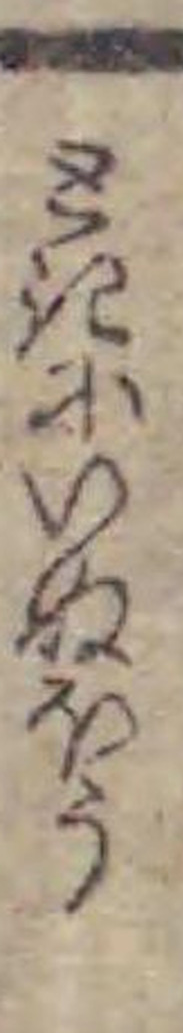ときにいぬほう
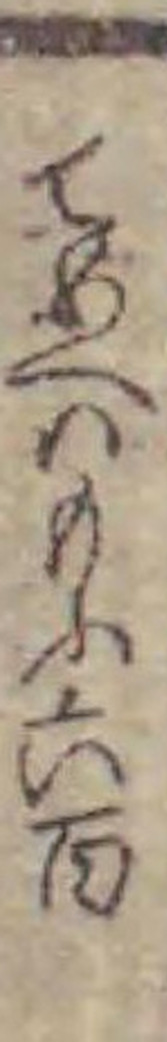てめへはもふ六百
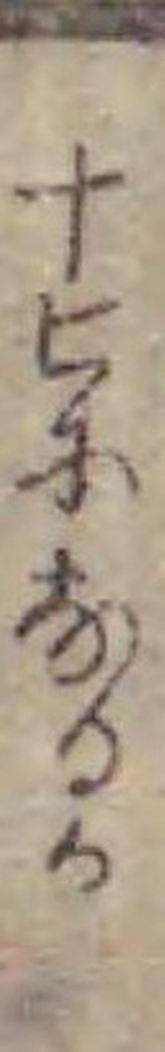十七になるか
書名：年寄之冷水曽我 : 3巻
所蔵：国立国会図書館 National Diet Library, JAPAN
